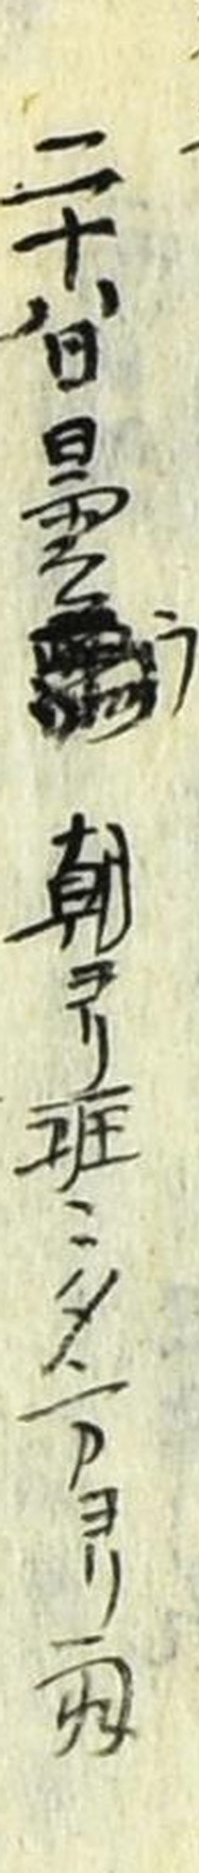二十八日曇雨朝ヨリ班々夕方ヨリ雨
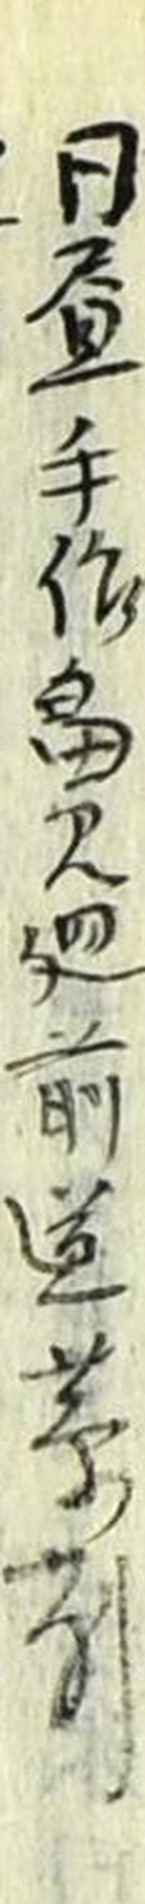同昼手伝畠見廻前道草刈
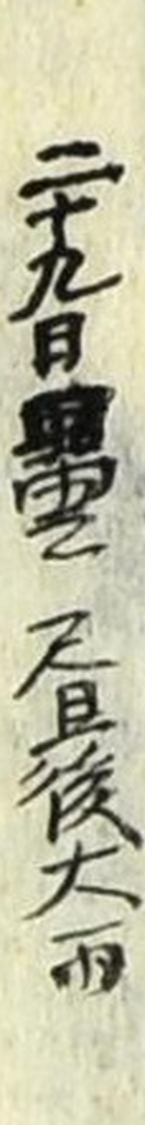二十九日曇昼後大雨
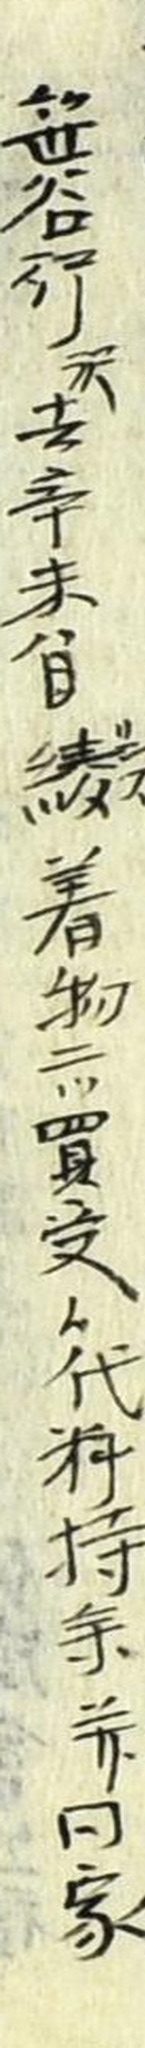笹谷行訳去辛未八月綾着物二ツ買受候代料持参幷同家
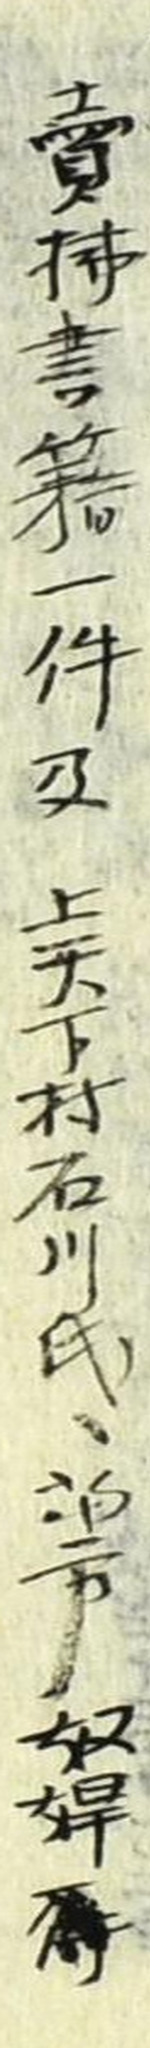売払書籍一件及上天下村石川氏へ当方奴娨
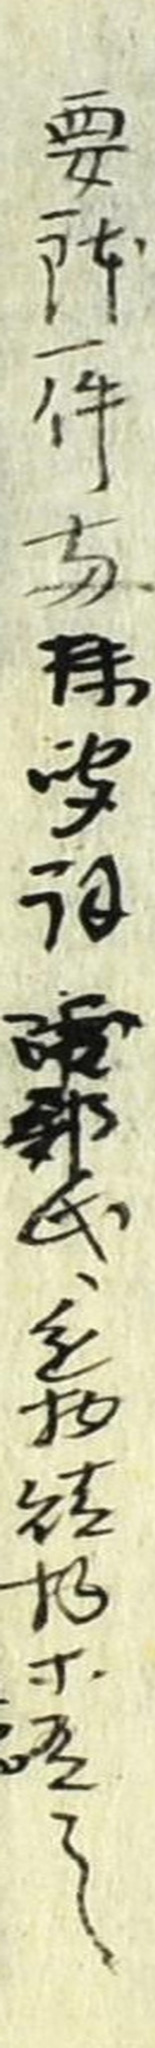要鉢一件両様聞調渡部氏へ進物賄物等有之
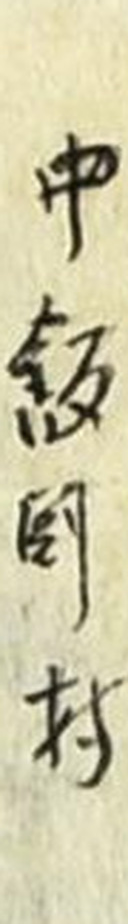中飯淵村
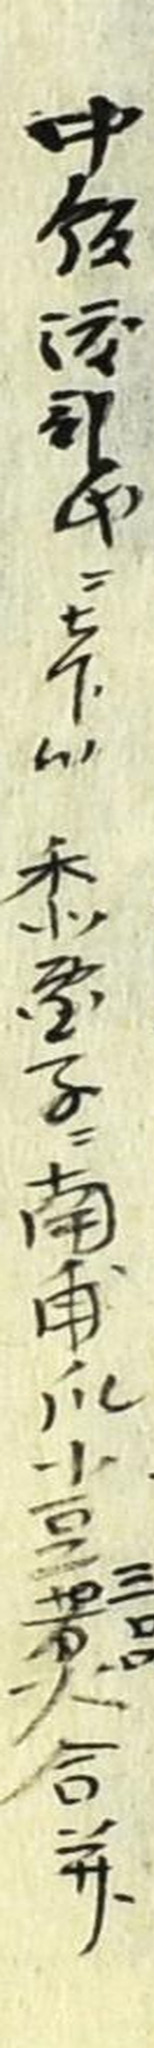中飯渡部氏ニ被下候黍団子ニ南甫瓜小豆煮合幷
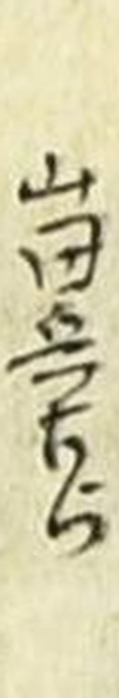山田兵右衛門
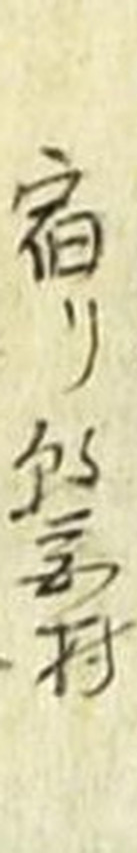宿リ朝宮村
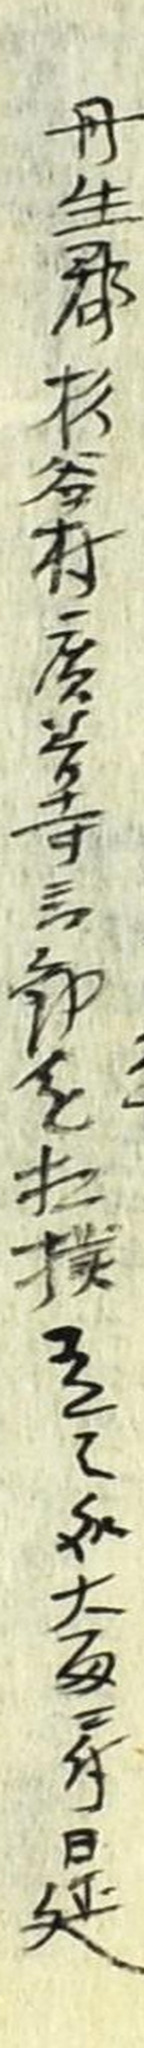丹生郡杉谷村広善寺ニ而勧進相撲有之処大雨ニ付日延
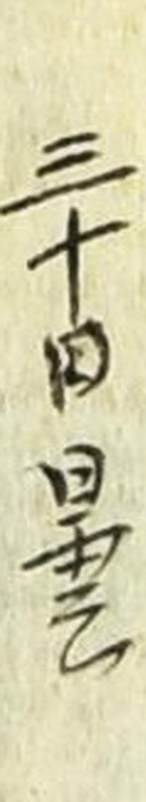三十日曇
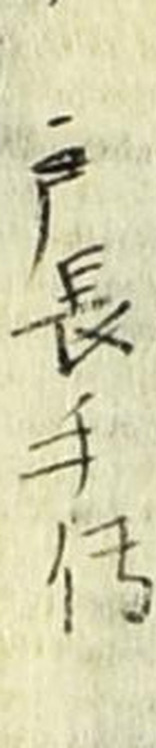戸長手伝

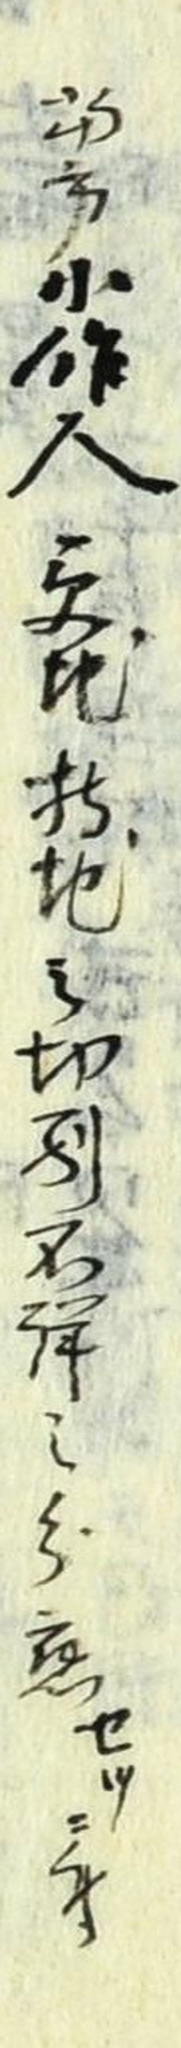当方小作人受地持地之切別不詳之分応セツニ付
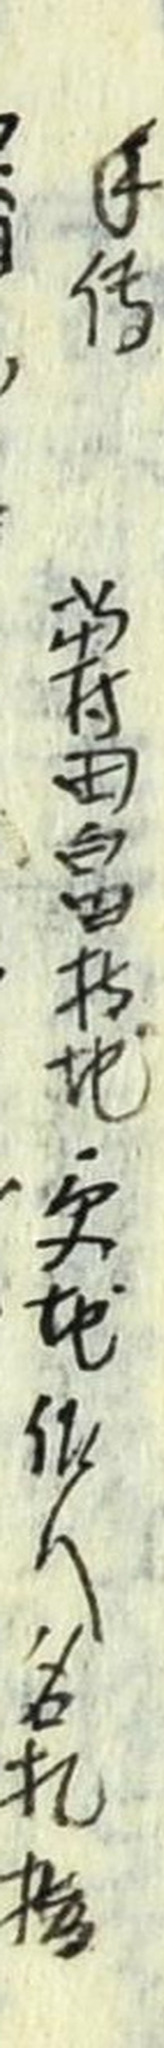手伝当村田畠持地受地作人名札指
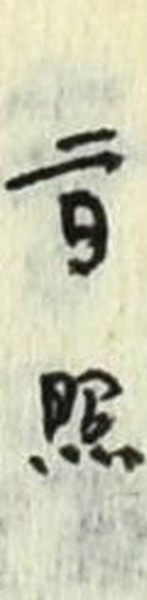三日照
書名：（日記）
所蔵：福井県文書館 Fukui Prefectural Archives
